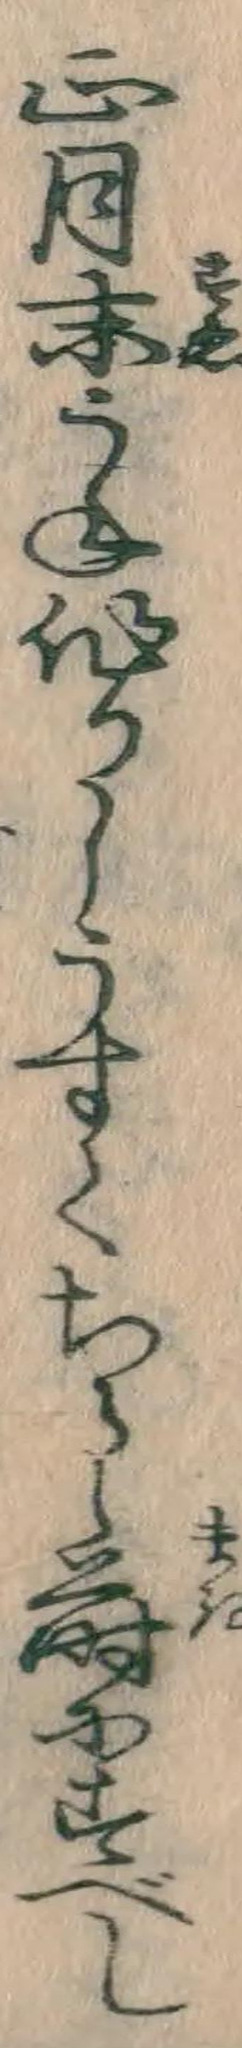正月末うね作りしうすくちらし蒔にすべし
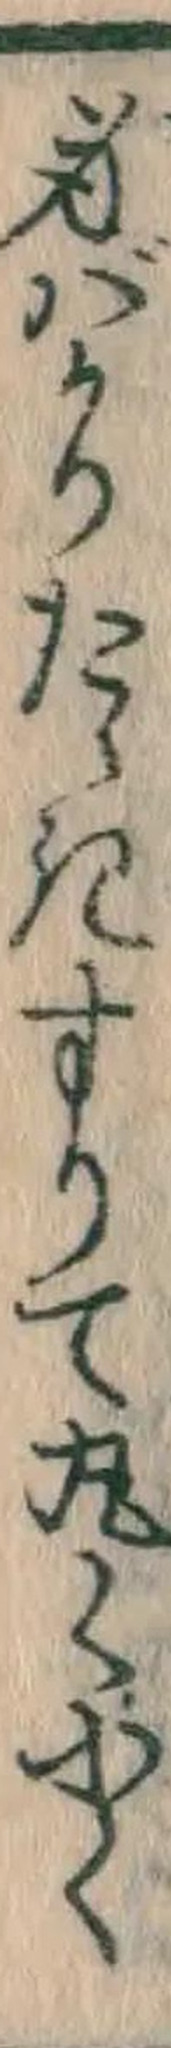身ばかりたゝきすりて丸く小く
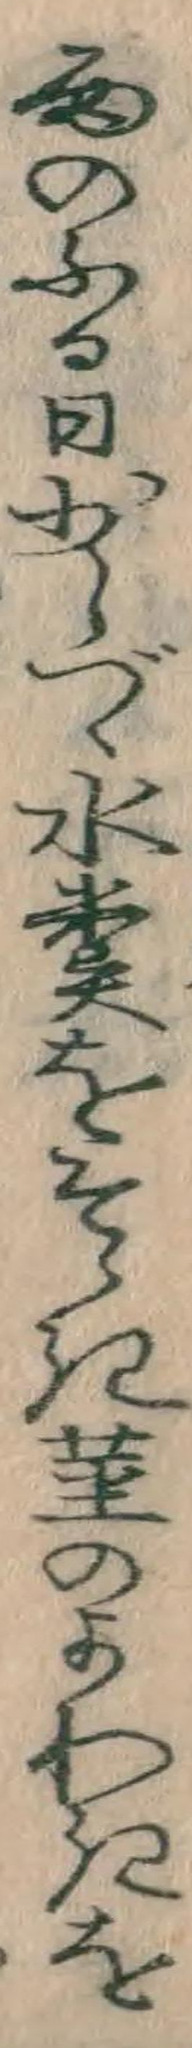雨のふる日少しづゝ水糞をそゝき茎のよわきを
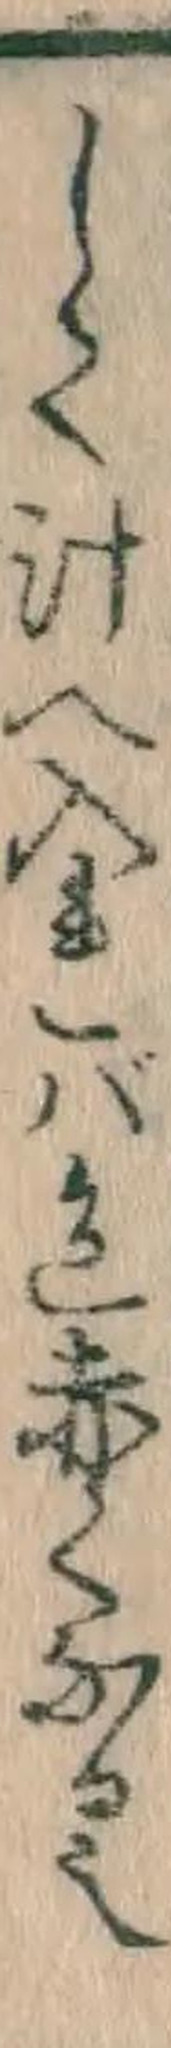して汁へ入れば色赤くなる也
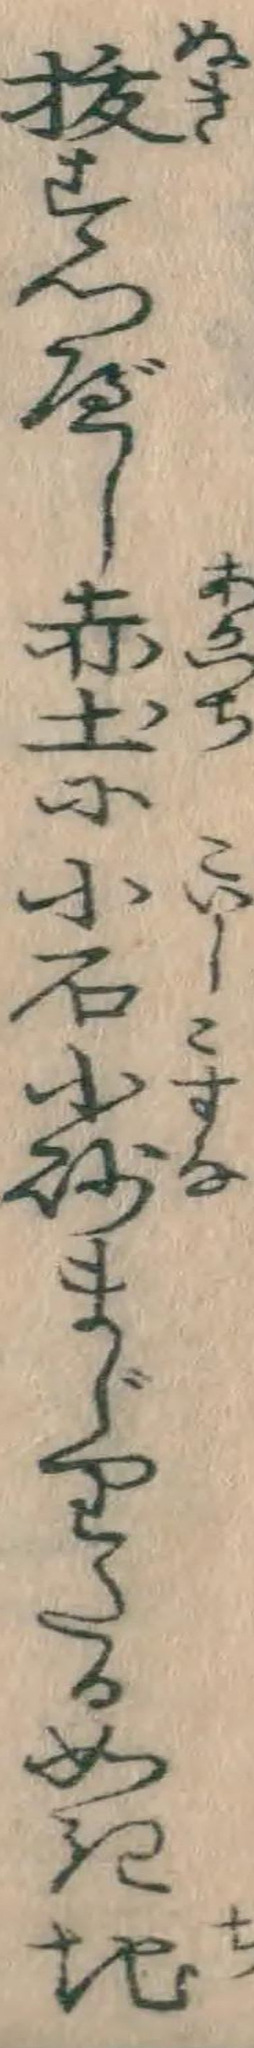抜すつべし赤土に小石小砂まじりたる如き地
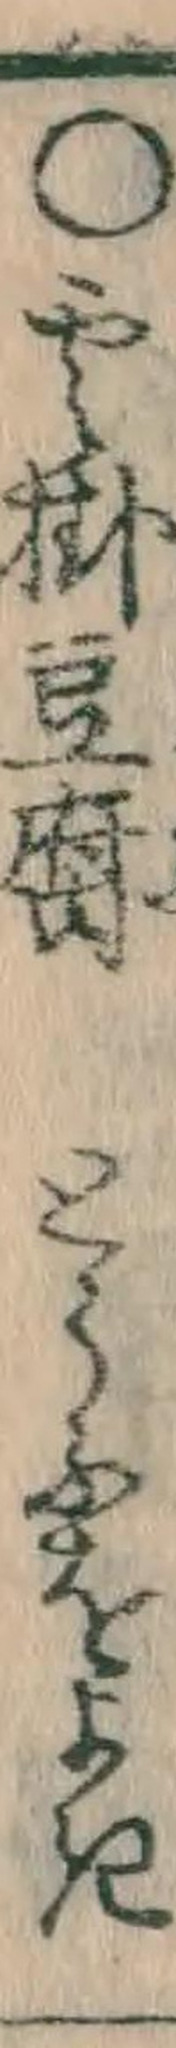○雲掛豆腐とうふをよき
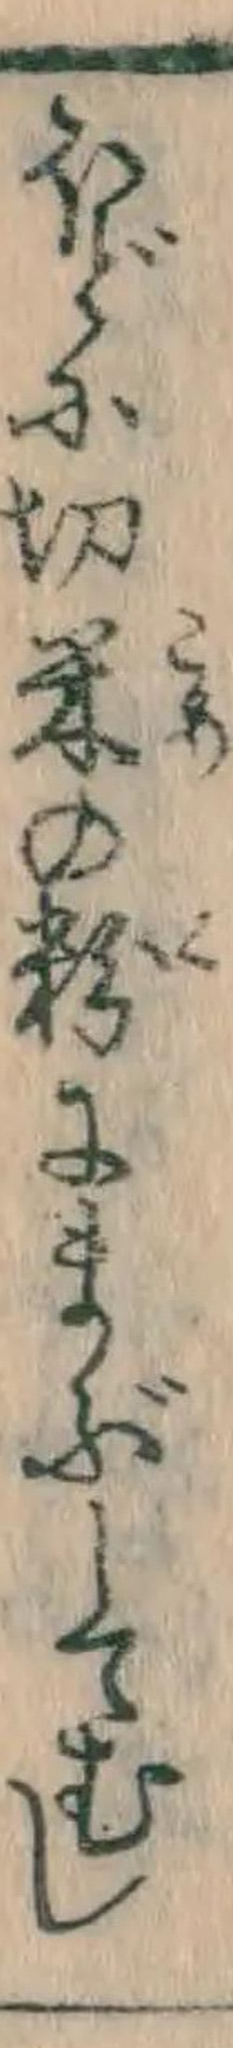ほどに切米の粉にまぶしてむし
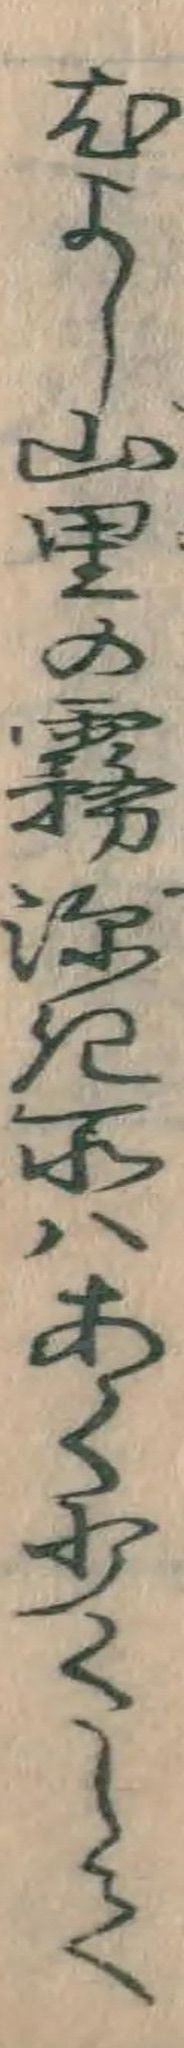尤よし山里の霧深き所はあく少くして
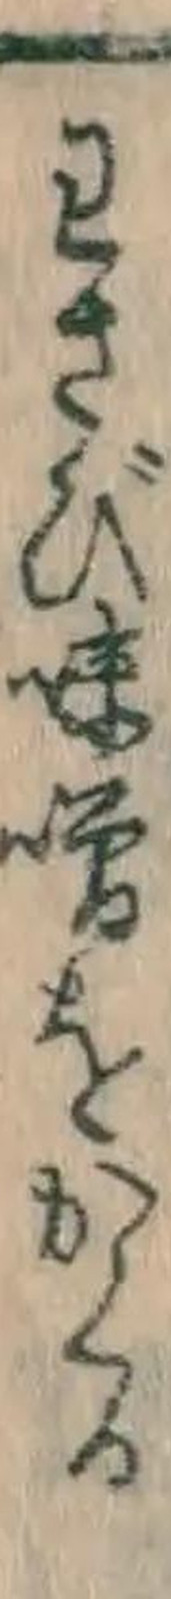わさび味噌をかくる
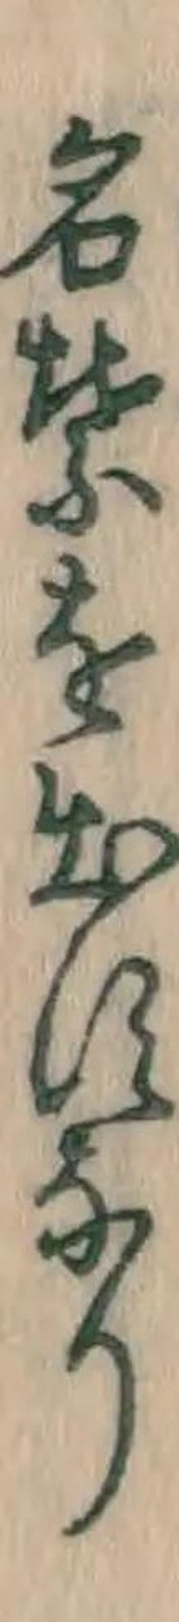名葉を出すなり

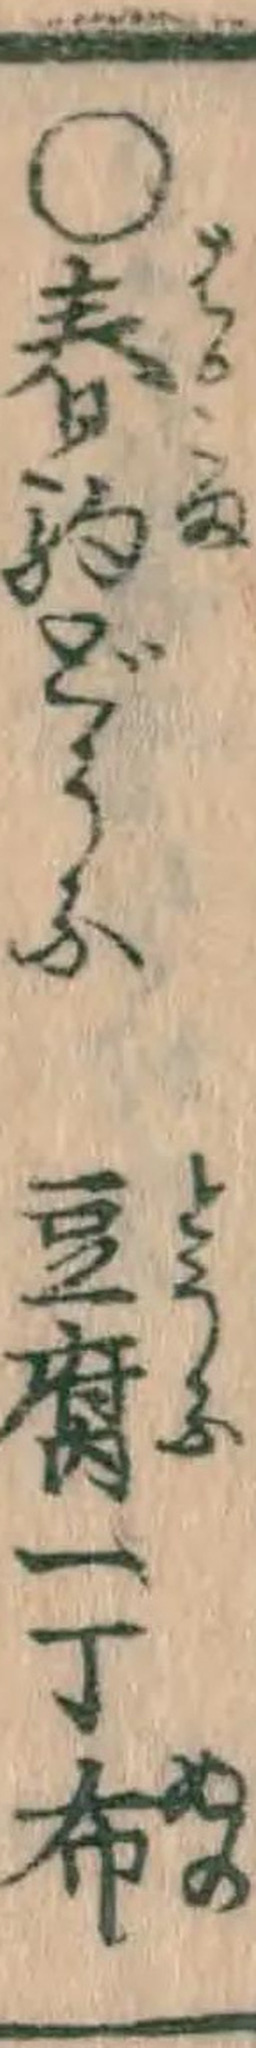○春駒どうふ豆腐一丁布
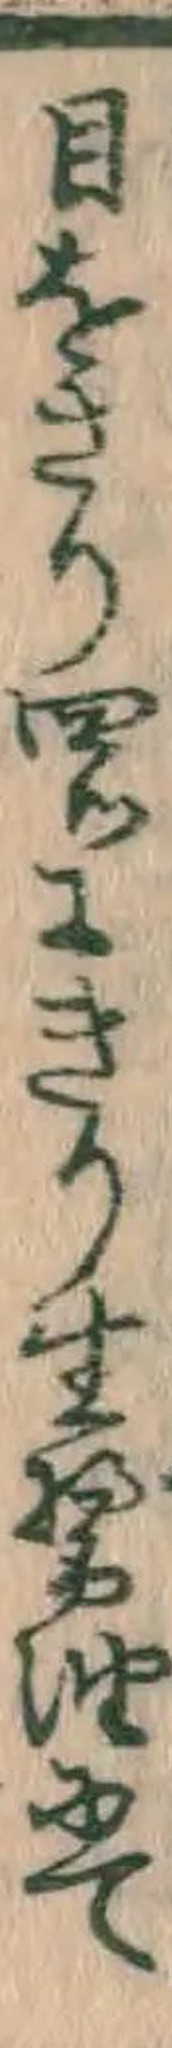目をさり四ッにきり生醬油にて
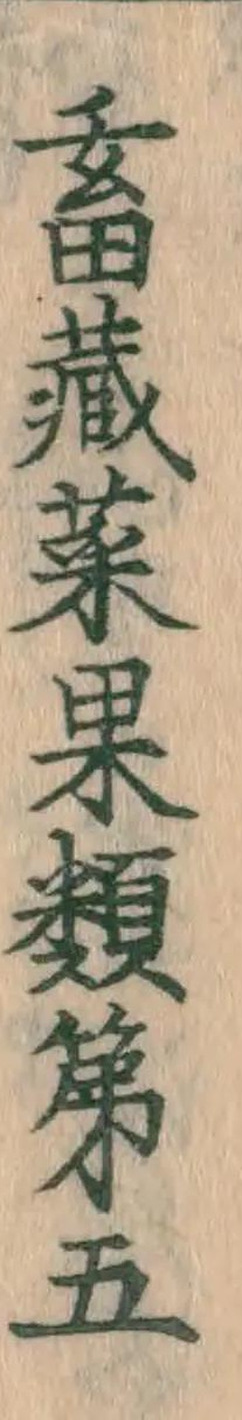畜蔵菜果類第五
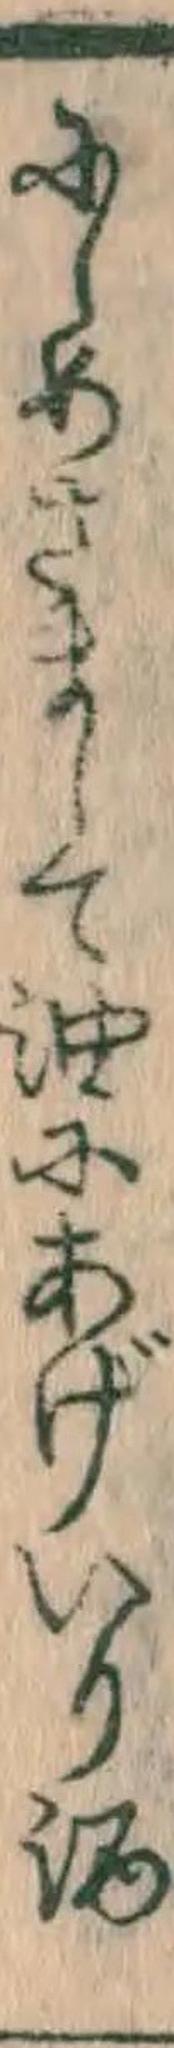にしめさまして油にあげいり酒
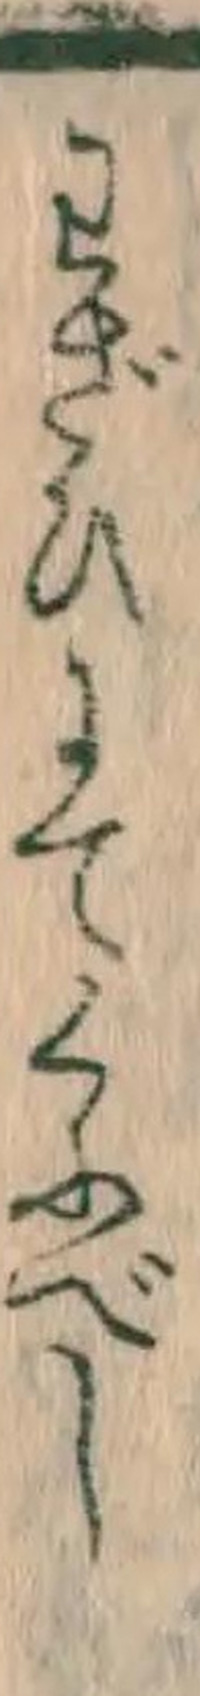わざひにてくふべし
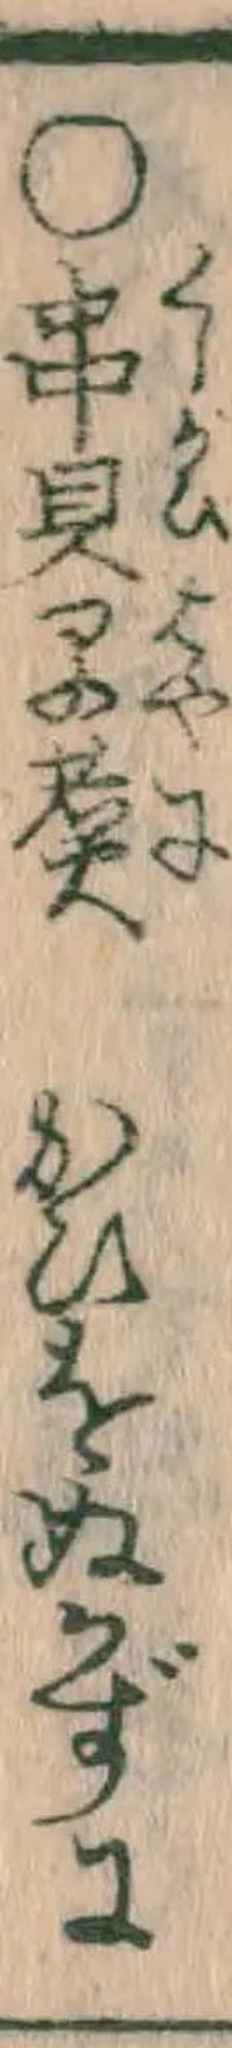○串貝早煮かひをぬかずに
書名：広益秘事大全 3巻. [5]
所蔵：国立国会図書館 National Diet Library, JAPAN
